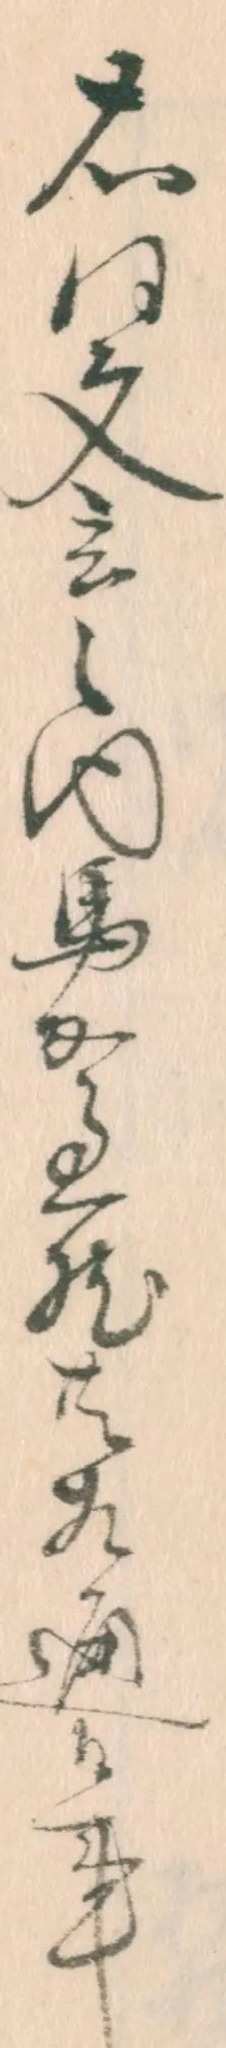右同文言之内馬駕籠共相通候事
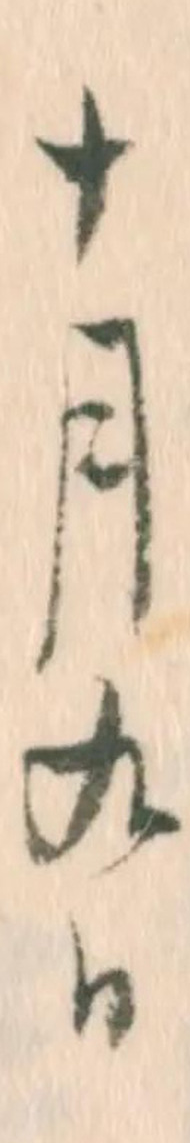十月九日

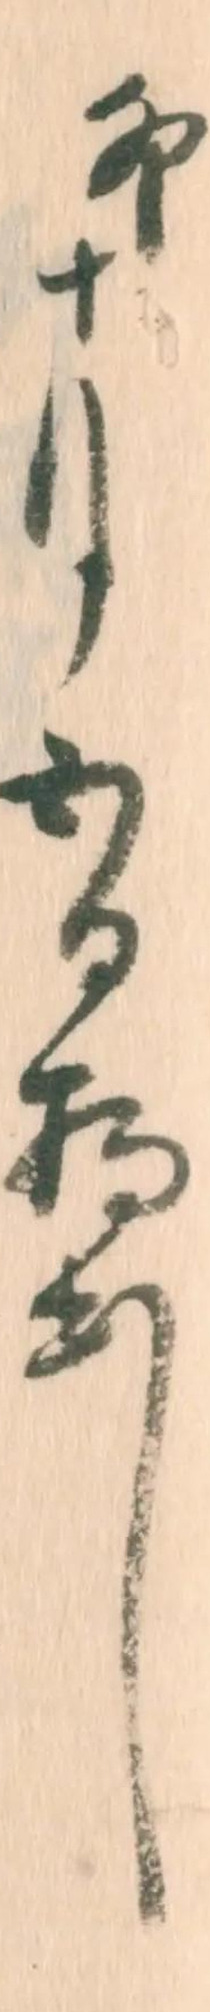卯十月五日持出し
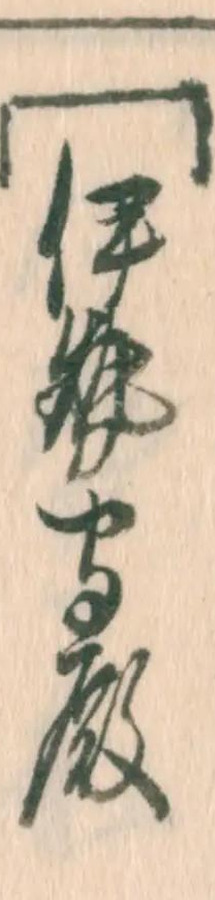[伊勢守殿
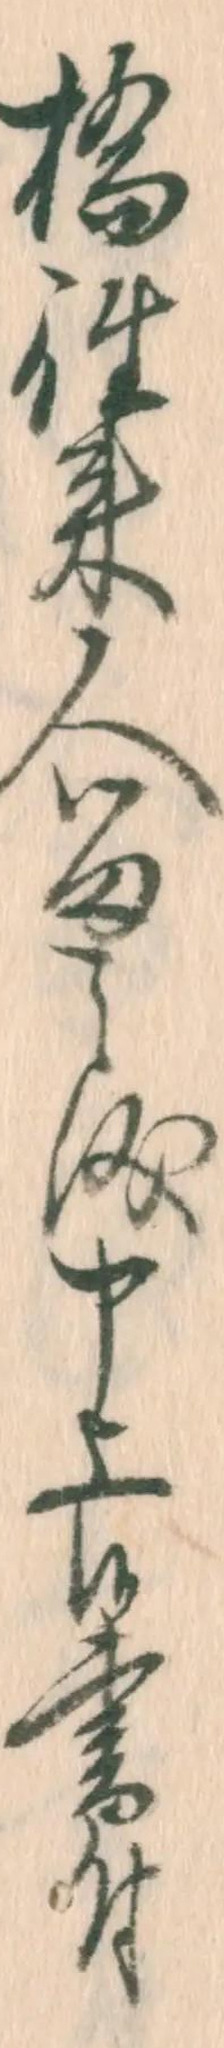橋往来人留之儀申上候書付
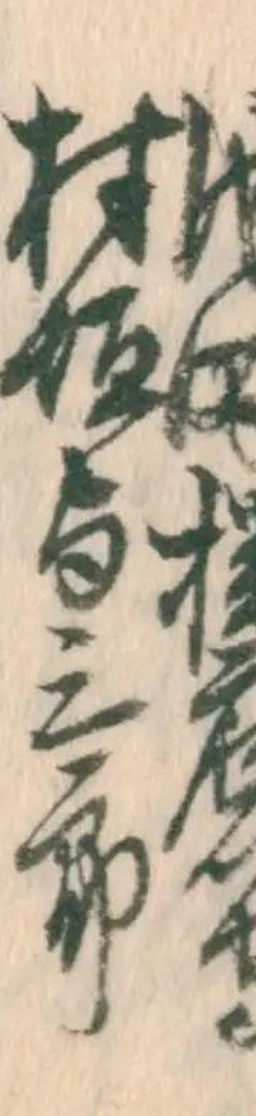村垣与三郎
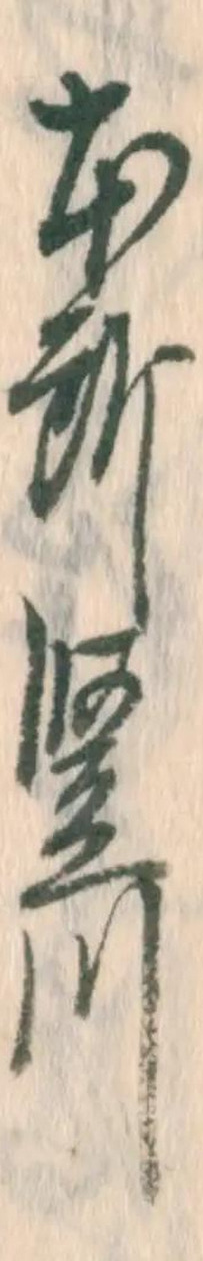本所竪川
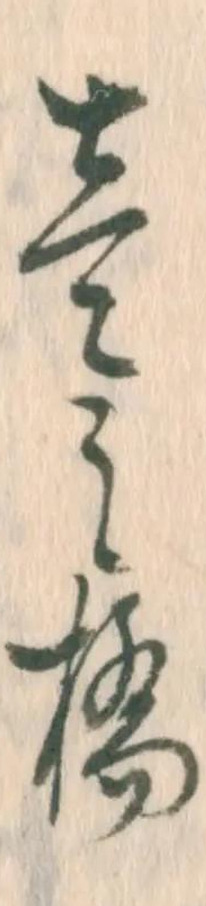壱之橋
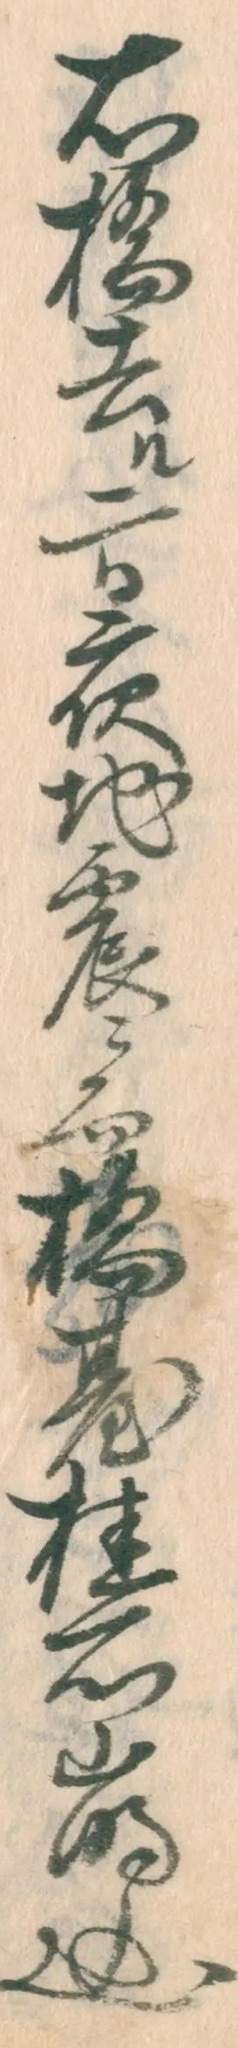右橋去ル二日夜地震ニ而橋台柱石崩込

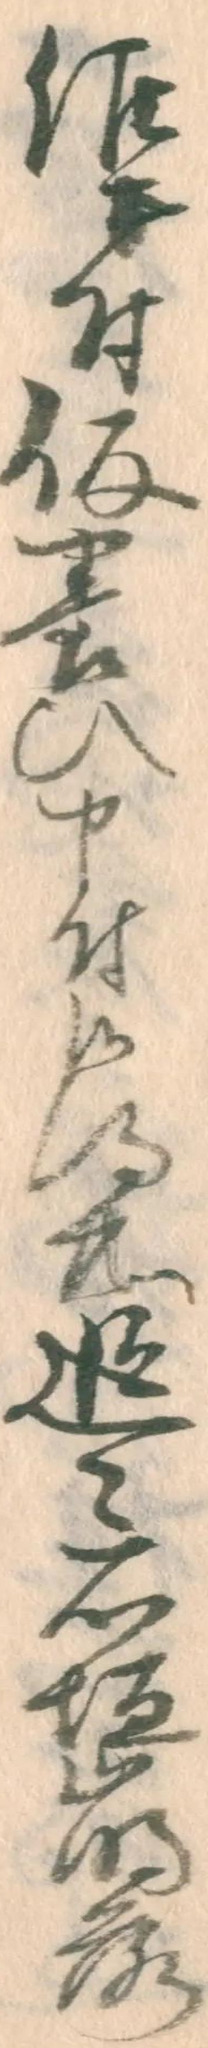候ニ付仮養ひ申付候得共追々石垣崩落
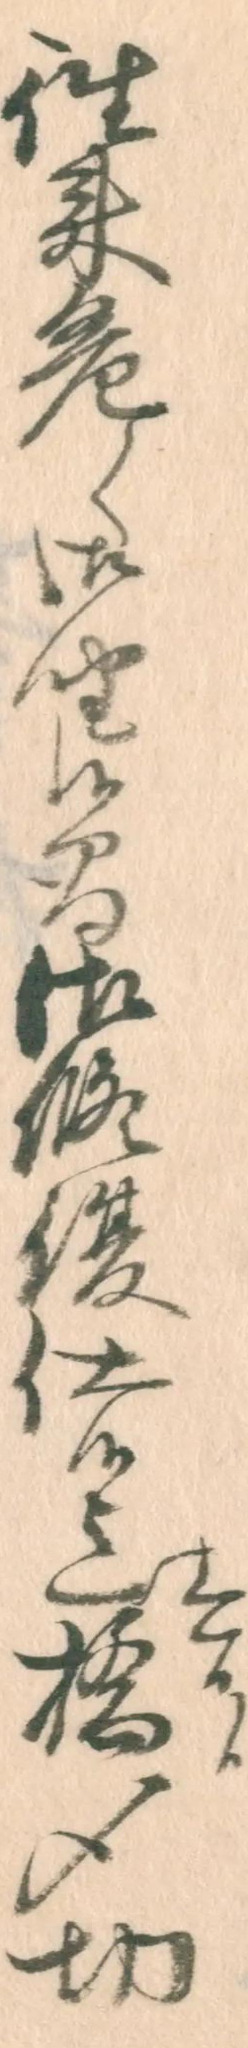往来危く御坐候間御修復仕候迄今日ゟ橋〆切
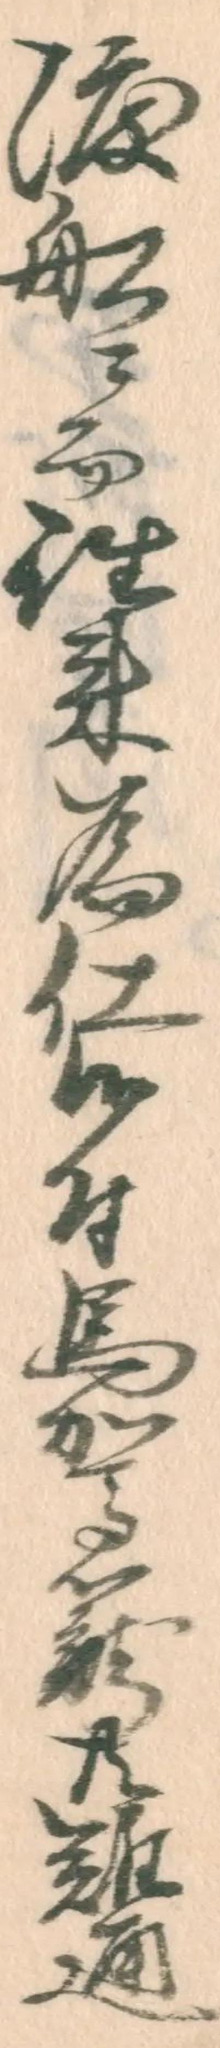渡船ニ而往来為仕候付馬駕籠共難通
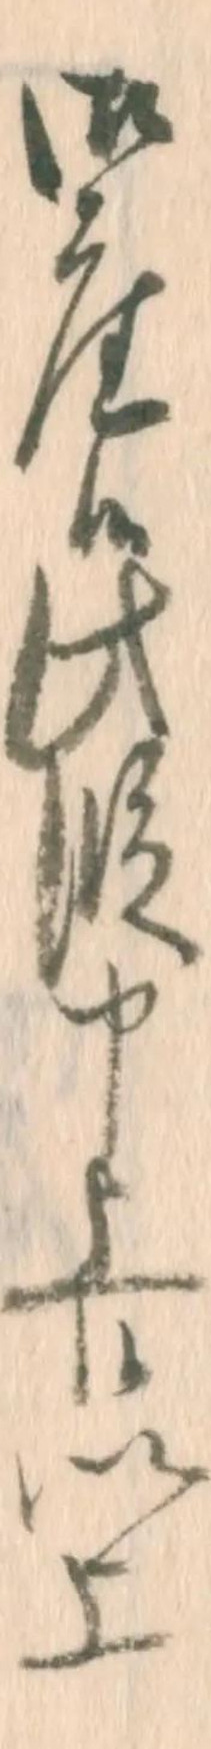御座候此段申上候以上
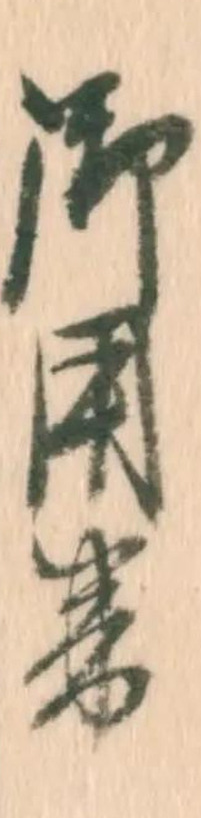御用書
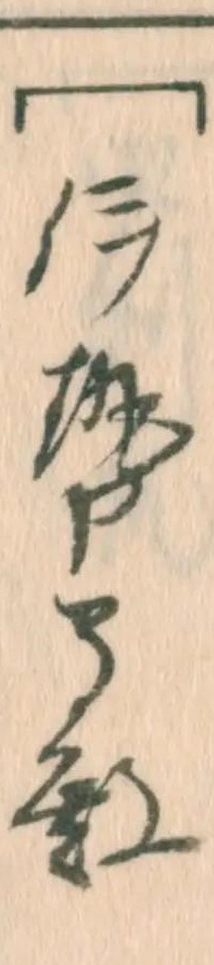[伊勢守殿
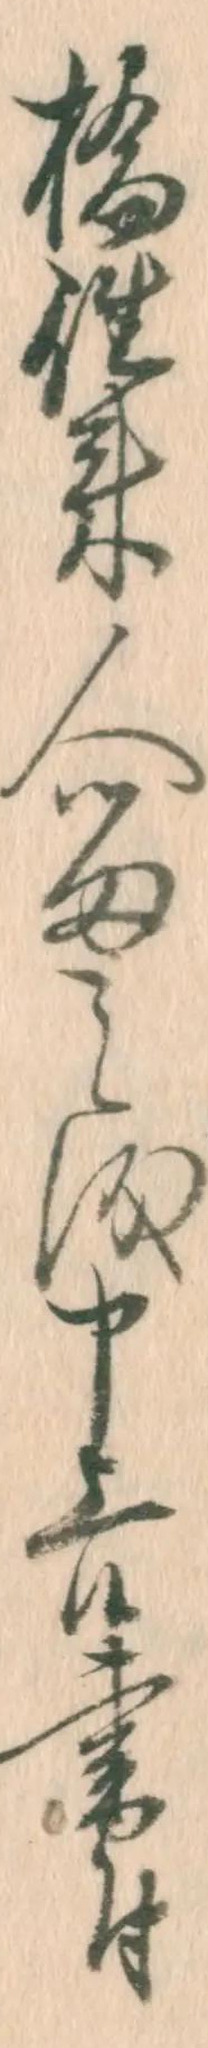橋往来人留之儀申上候書付
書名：地震災書留 2巻. [1] 内表紙に「地震災書留　安政二卯年　但本所深川御用屋敷地代免除調」とあり
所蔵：国立国会図書館 National Diet Library, JAPAN
